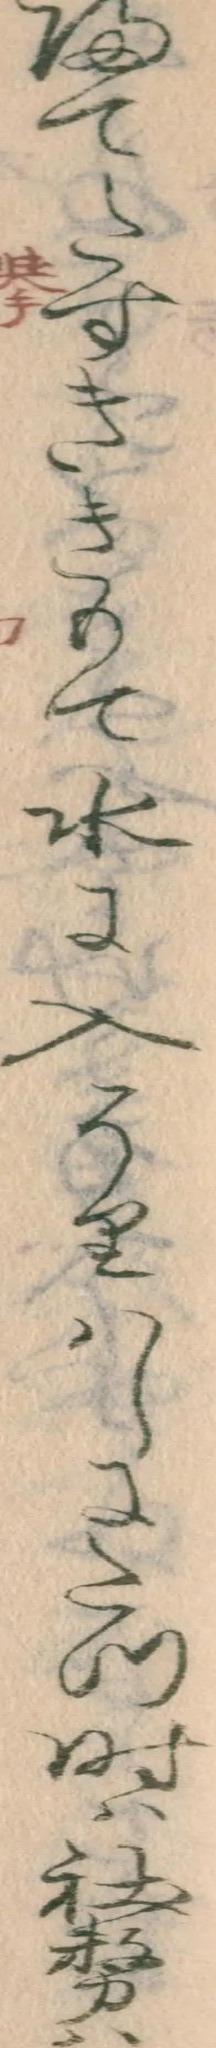帰てたすききりて水に入そりはしにたつ時は社務は
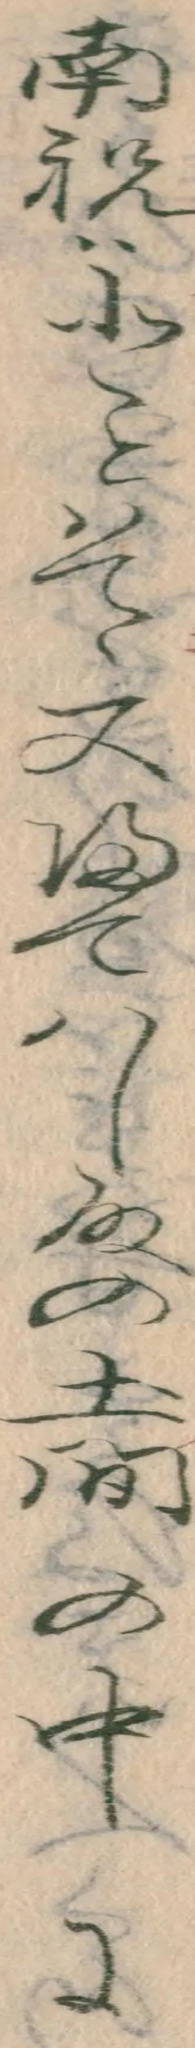南祝は北ことはてゝ又帰てはし殿の土間の中に
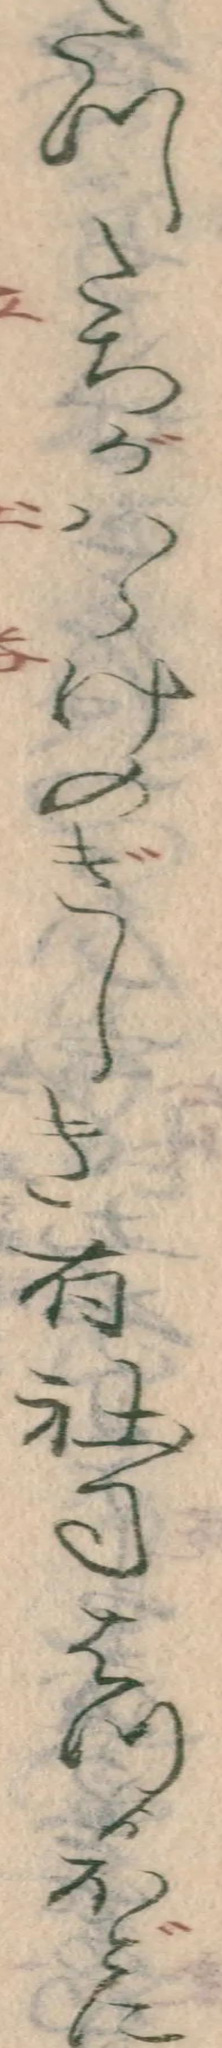たつたちがはらけのぎしき有社司はつかほどに
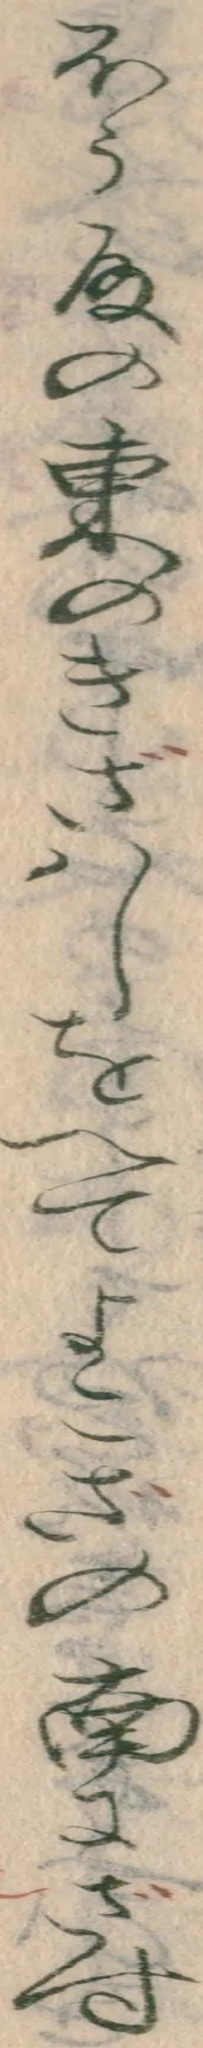ほう殿の東のきざはしをへてよこざの南にざす
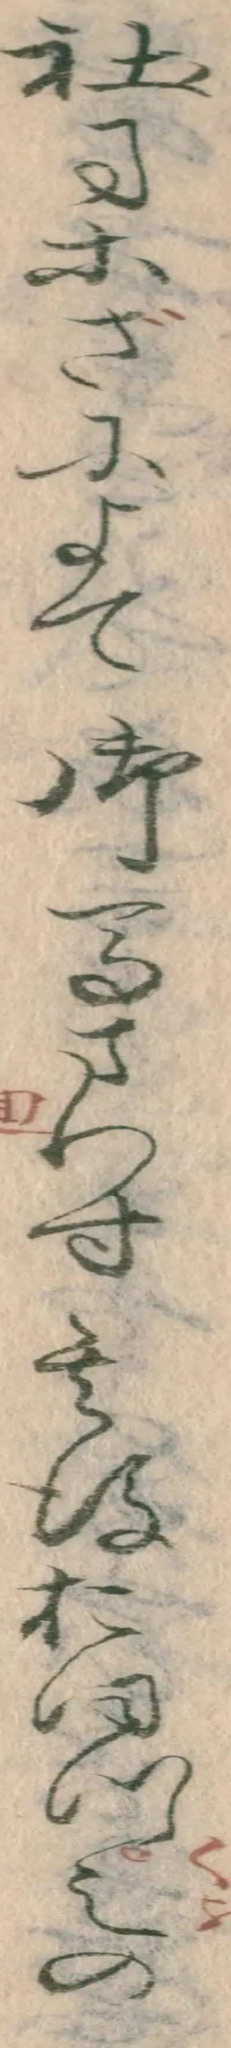社司等ざによて御馬まわす其後おほつ◦えの
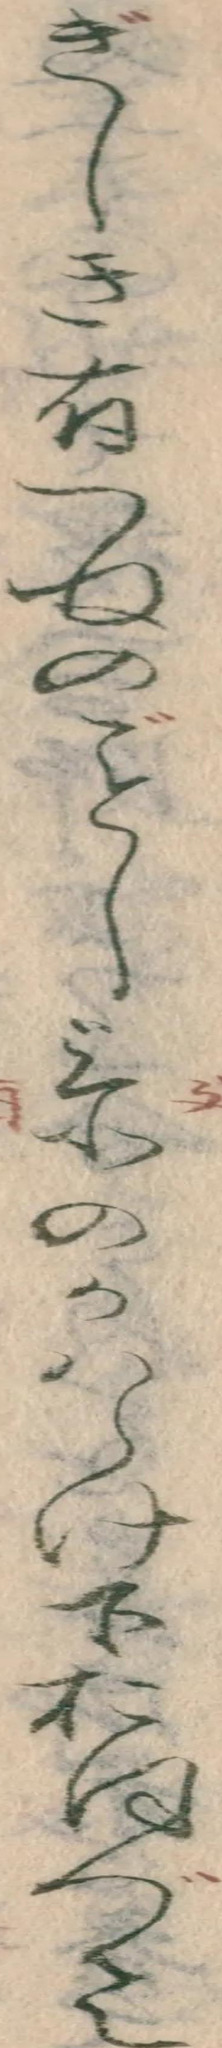ぎしき有つねのごとしとそのかはらけ下おほづくえ
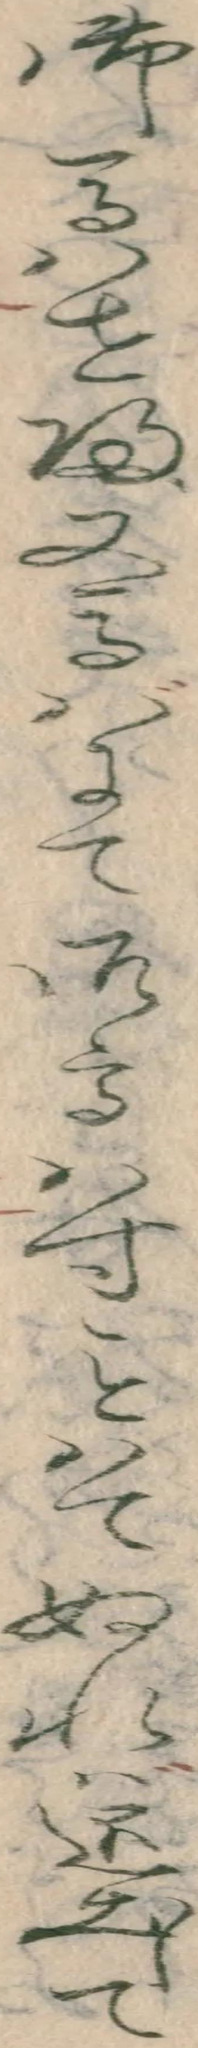御馬はせ帰又馬ばにて御馬はすことはてぬれば退出して
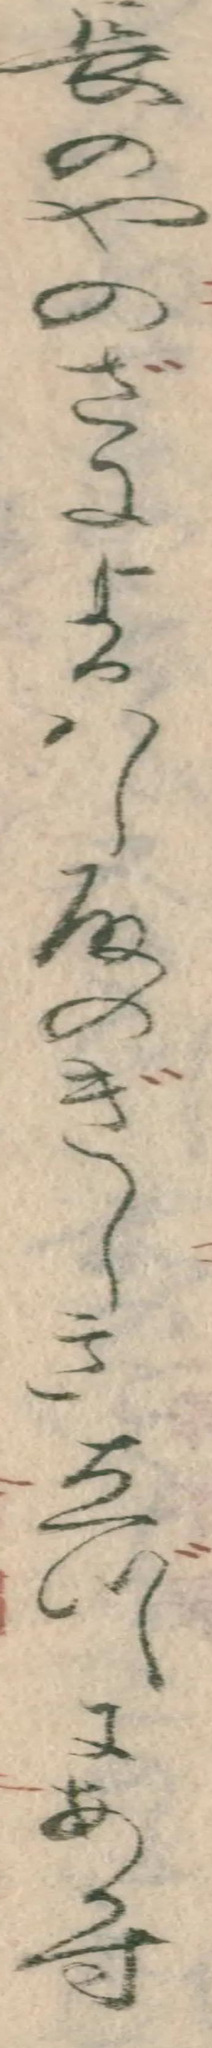長のやのざによるはし殿のぎしきゑづにあかす
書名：賀茂社記録. 第3冊
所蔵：国立国会図書館 National Diet Library, JAPAN
